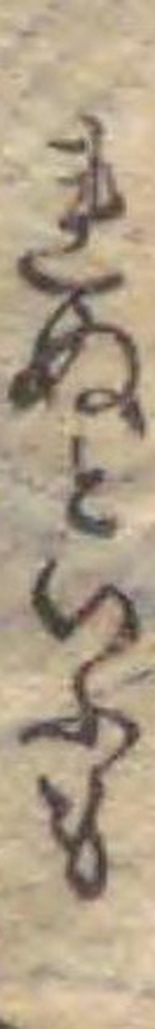れぬといも
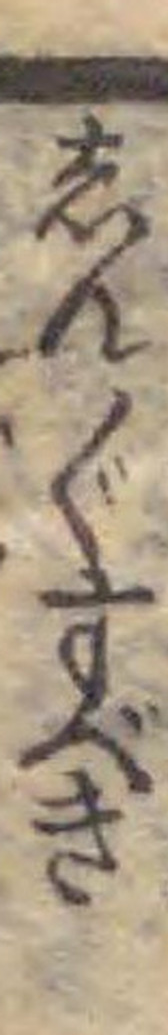しん〴〵すべき
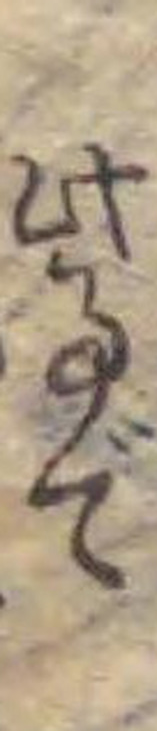此事で
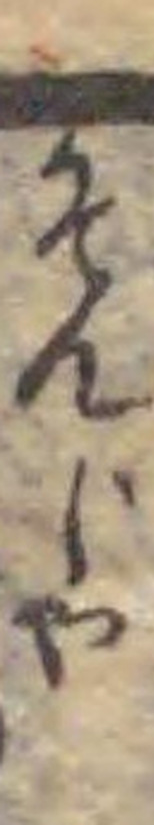そんじや
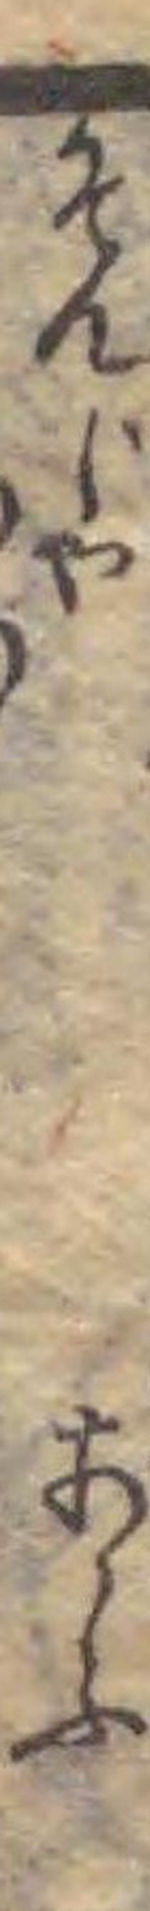そんじやくふは
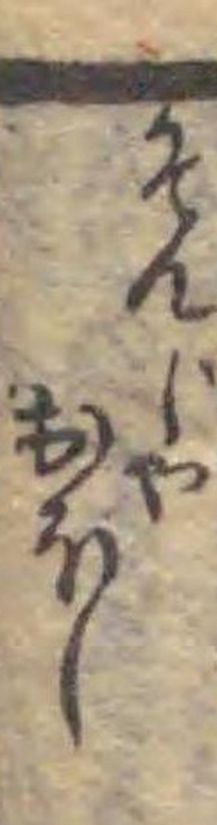おほし
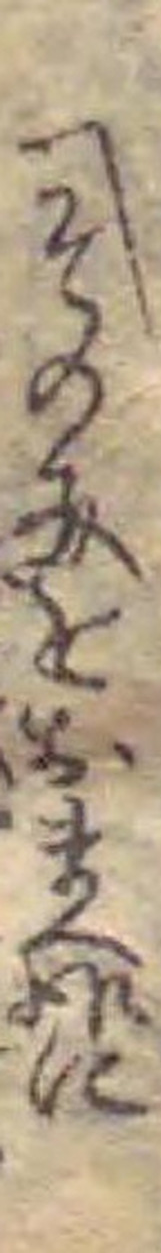〽その文をおまへ様に
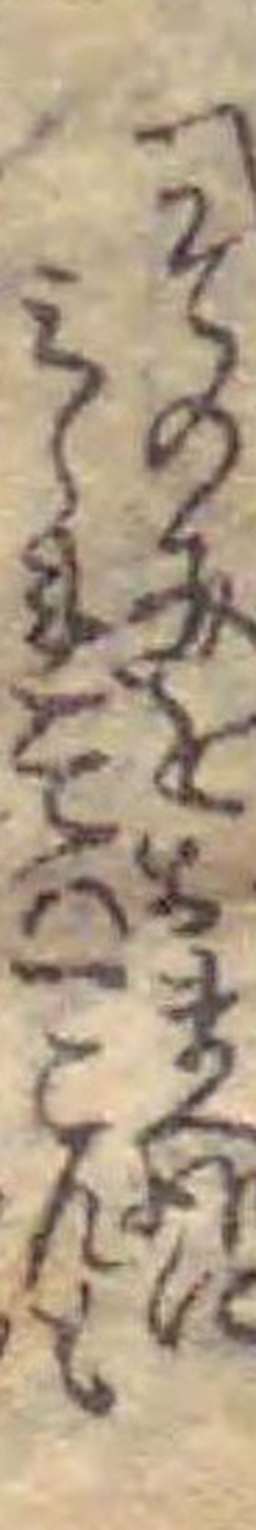みられては一こんも
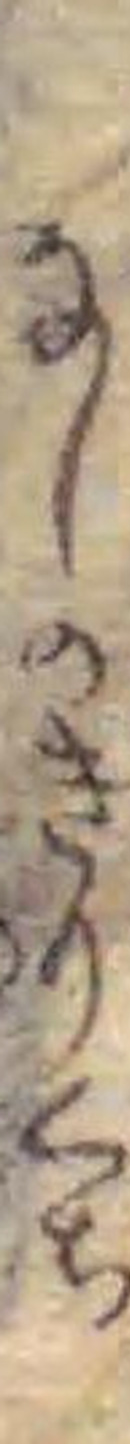なしのきりくち
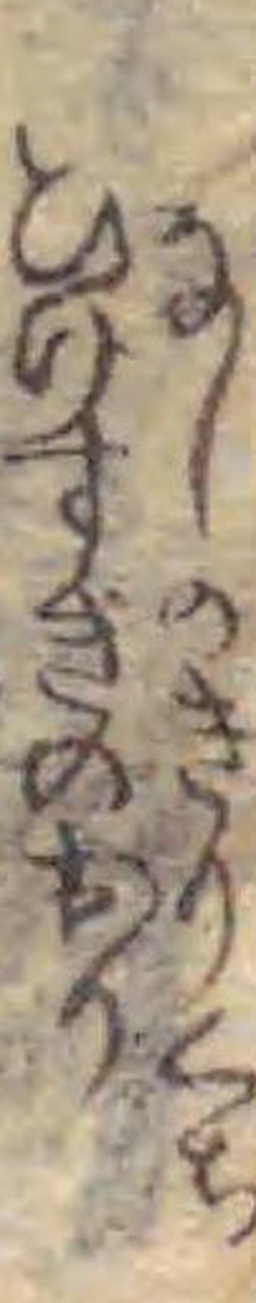ひけすぎのおり
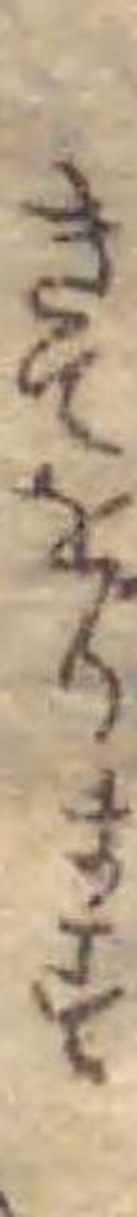きてをります

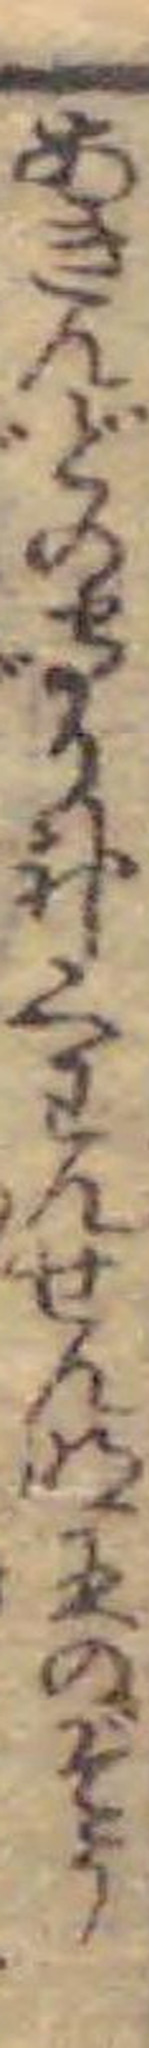あきんどの守り神くわんせん明王のぞう
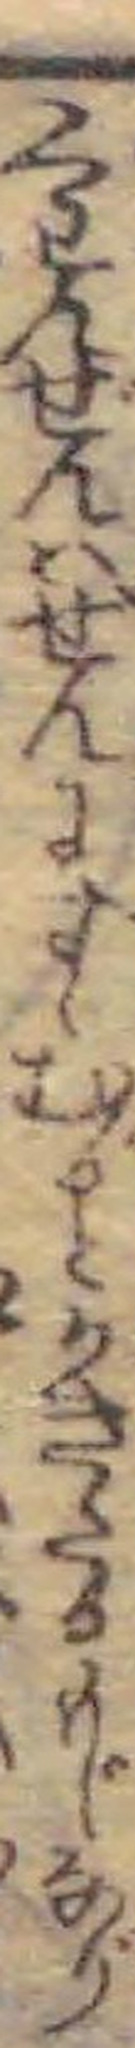くわんぜんはぜんにすゝむるとかきたるもじなり
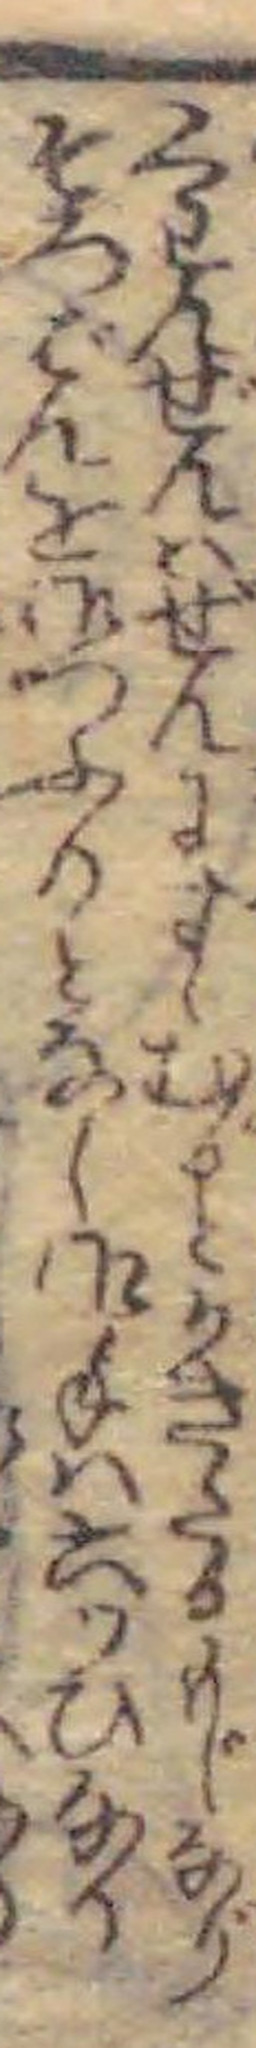そろばんを御つふりとなし御手は六つひなり
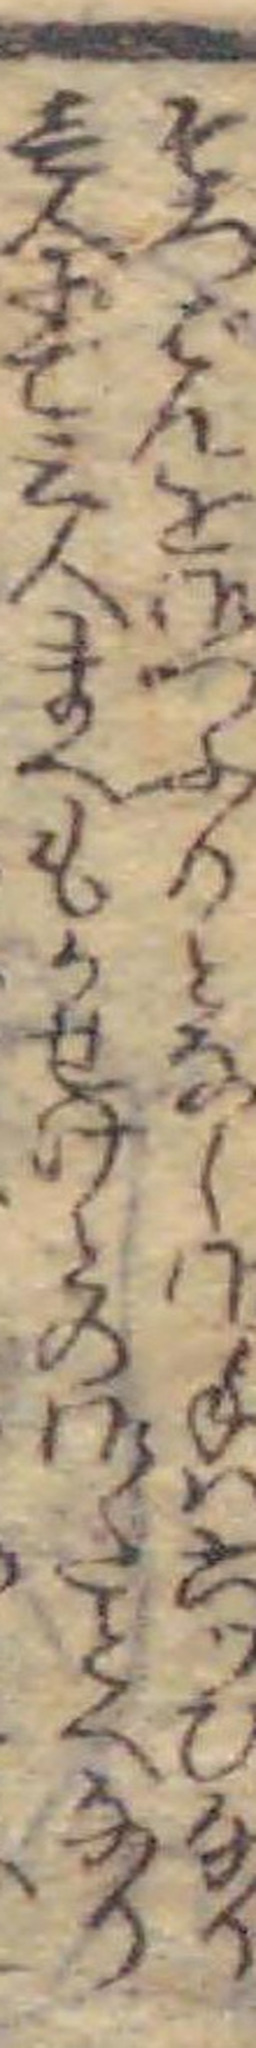壱人にて三人まへもかせけとの恩たとへなり
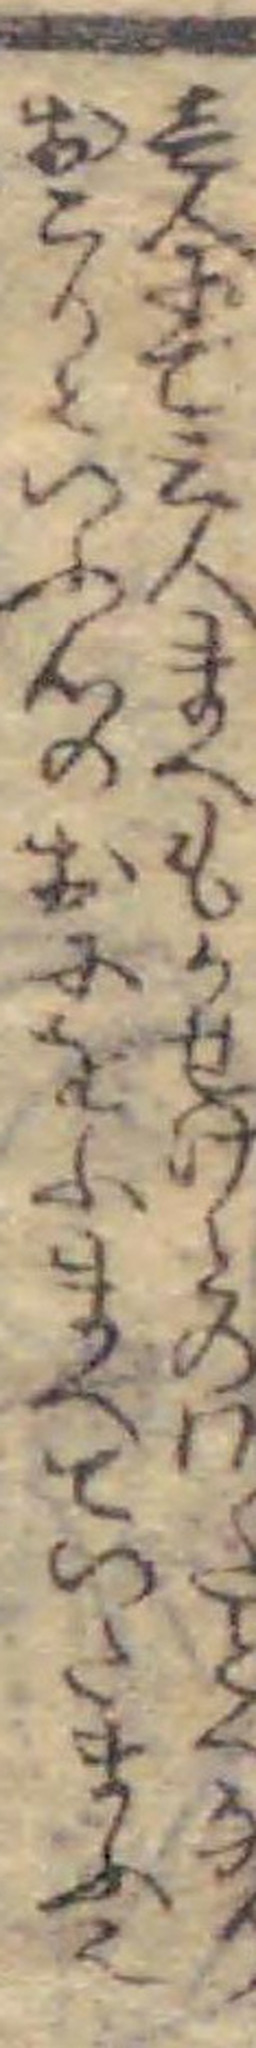おこりとおふ心のおにをまへていたまふ也
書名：身体開帳略縁起 : 3巻
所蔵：国立国会図書館 National Diet Library, JAPAN
